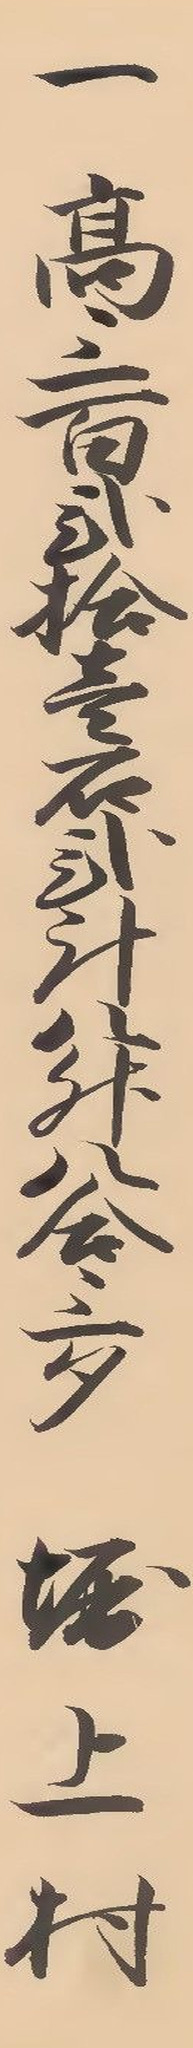一高三百弐拾壱石弐斗八升八合三勺堀上村
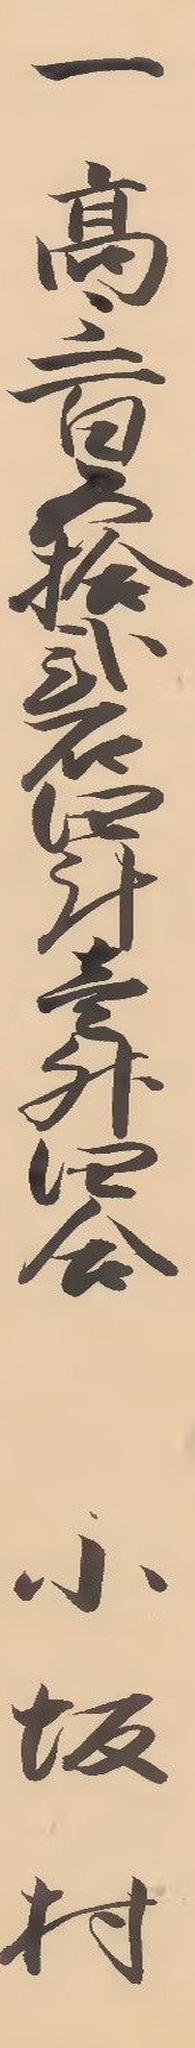一高三百五拾弐石四斗壱升四合小坂村
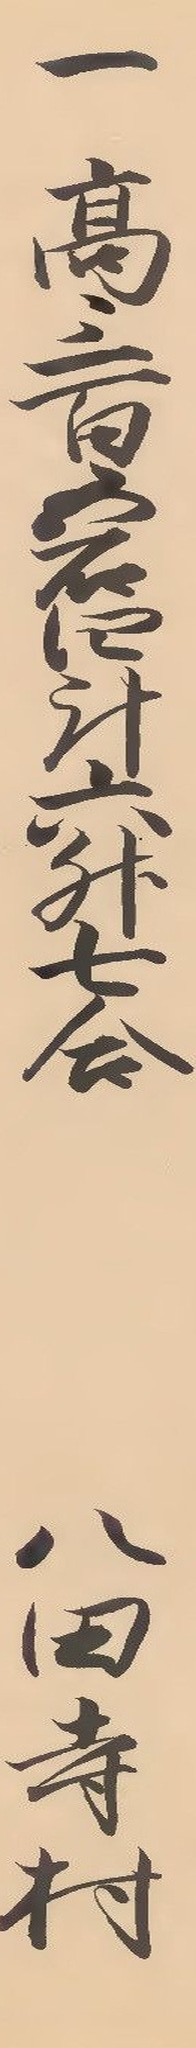一高三百五石四斗六升七合八田寺村
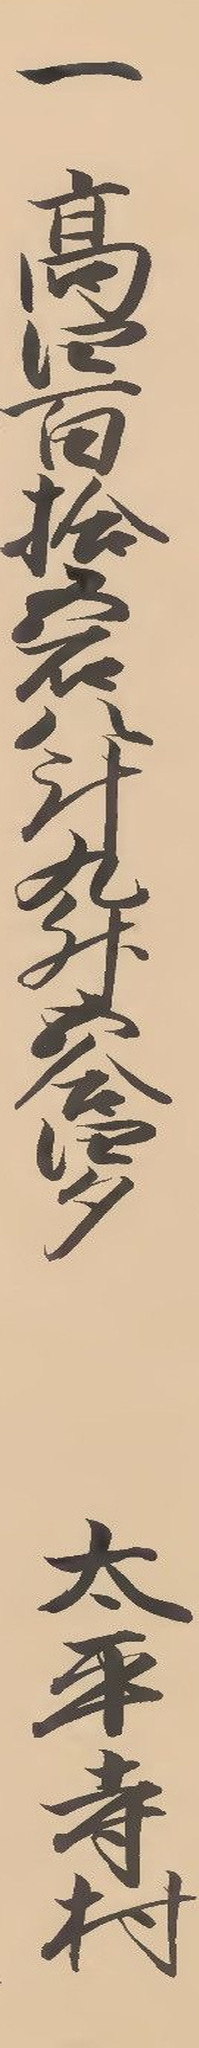一高四百拾五石八斗九升五合四勺太平寺村
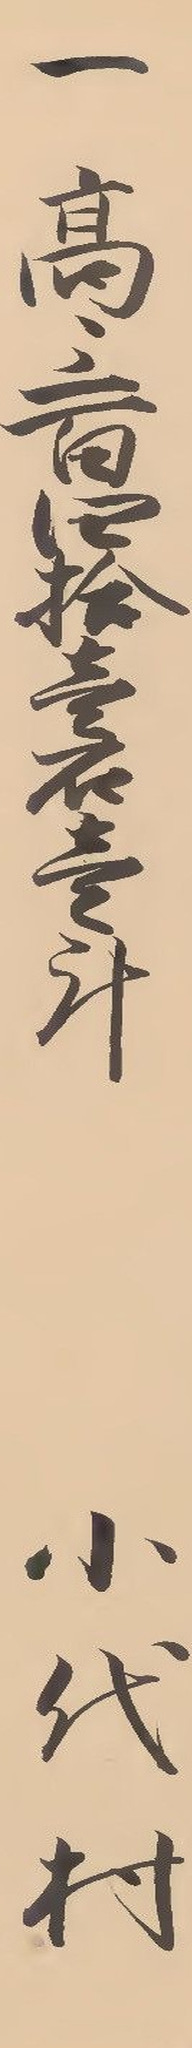一高三百四拾壱石壱斗小代村
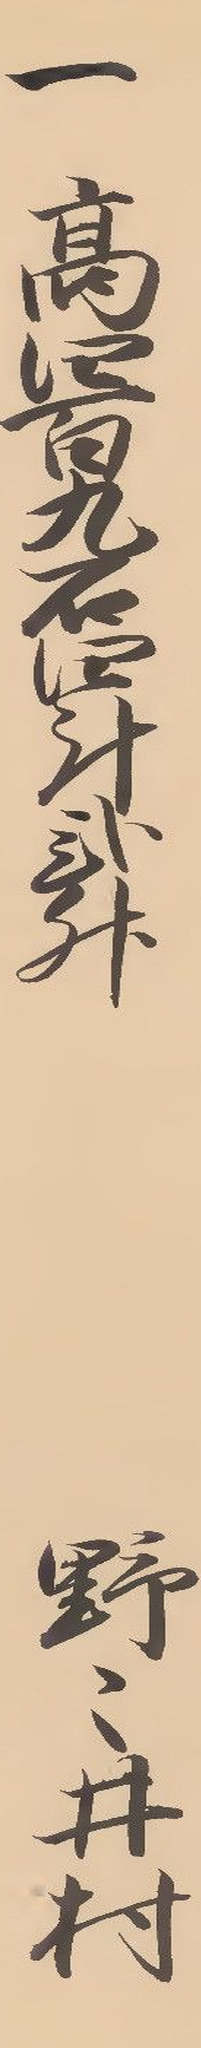一高四百九石四斗弐升野々井村
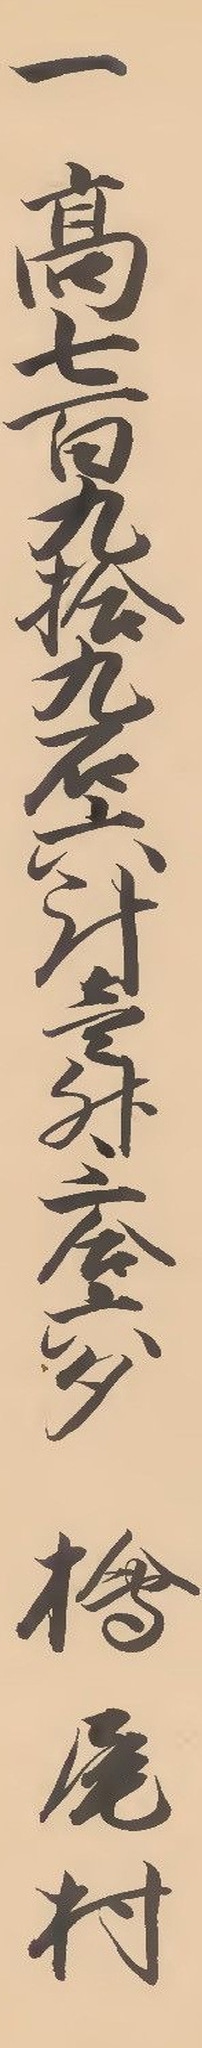一高七百九拾九石六斗壱升三合六勺桧尾村

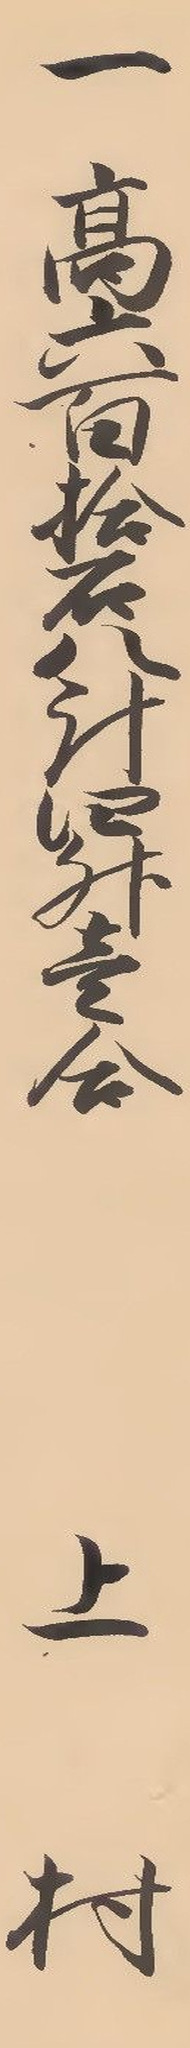一高六百拾石八斗四升壱合上村
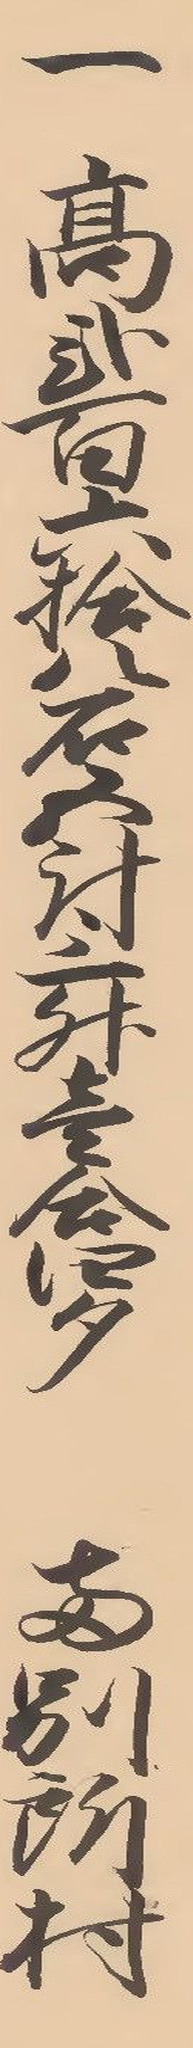一高弐百六拾八石五斗三升壱合四勺南別所村
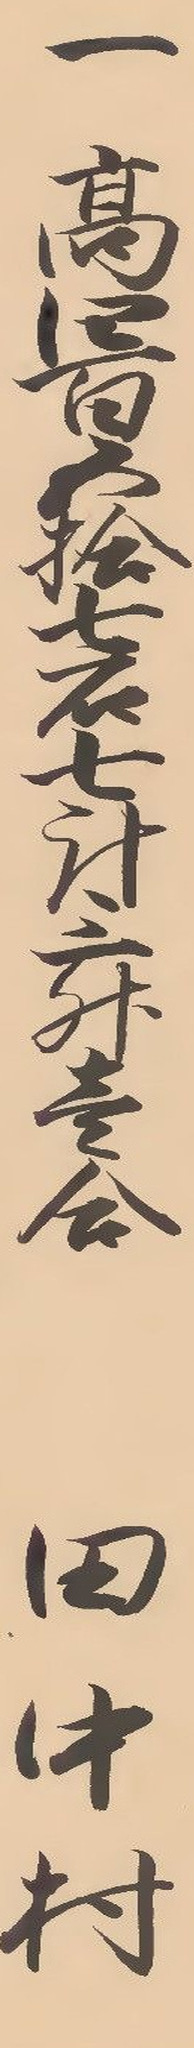一高四百五拾七石七斗三升壱合田中村
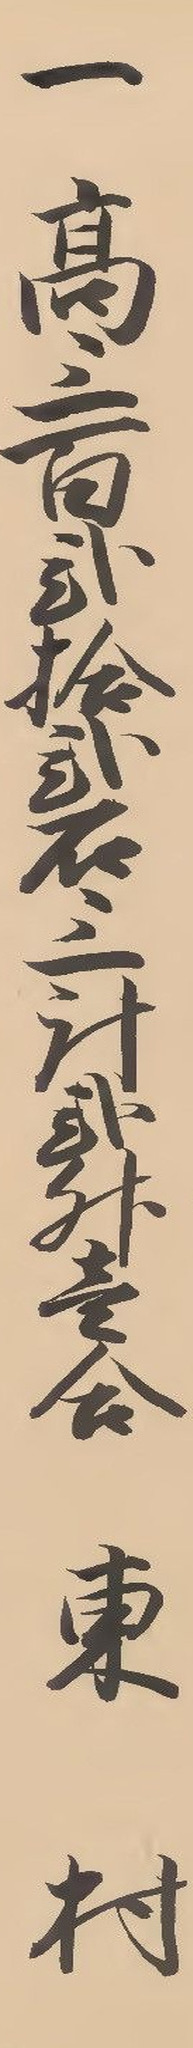一高三百弐拾弐石三斗弐升壱合東村
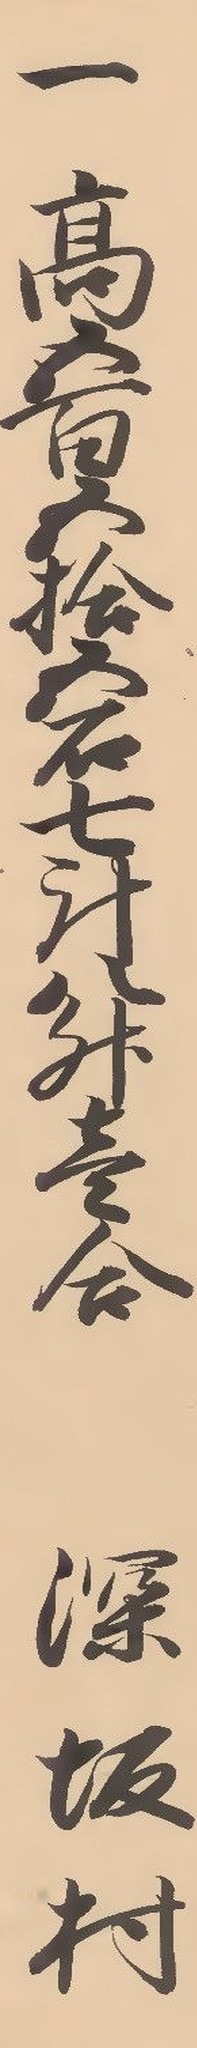一高五百五拾五石七斗八升壱合深坂村
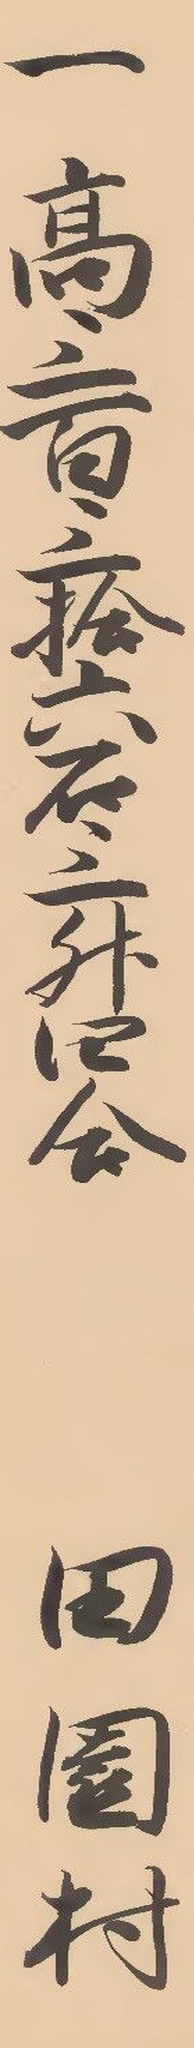一高三百三拾六石三升四合田園村

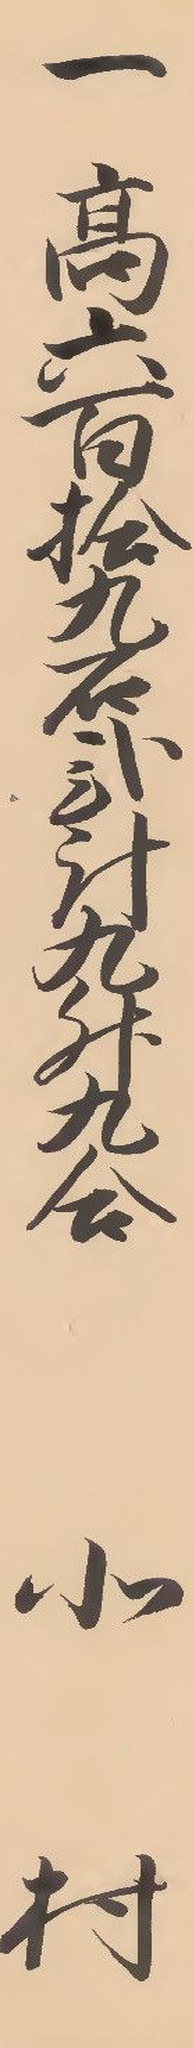一高六百拾九石弐斗九升九合北村
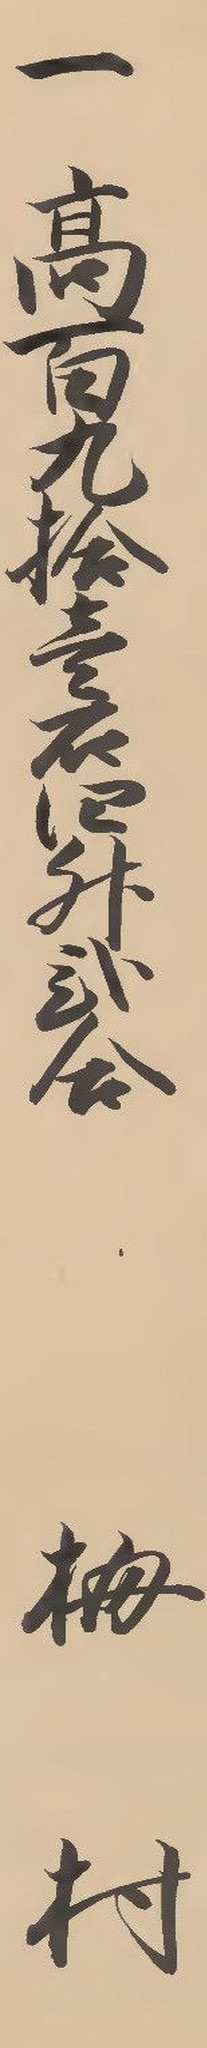一高百九拾壱石四升弐合栂村
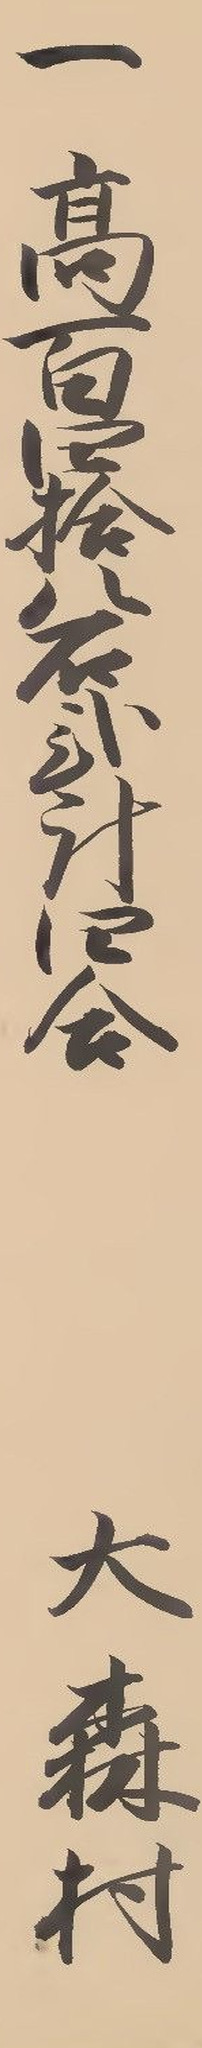一高百四拾八石弐斗四合大森村
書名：和泉国郷帳
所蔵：国立公文書館 National Archives of Japan
